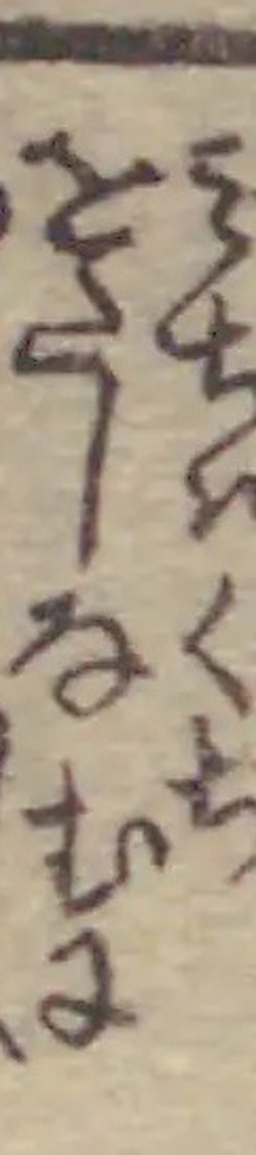をたしなむに
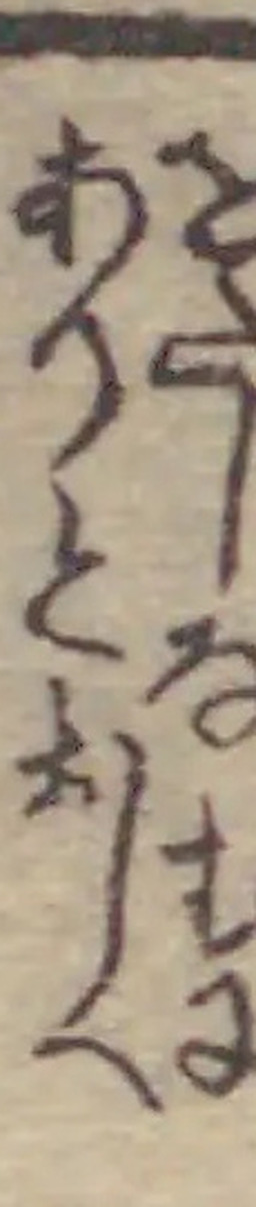ありとおしへ
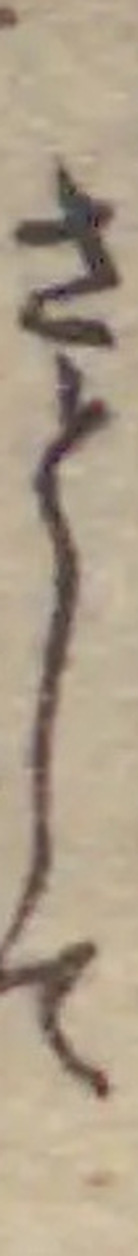さとして
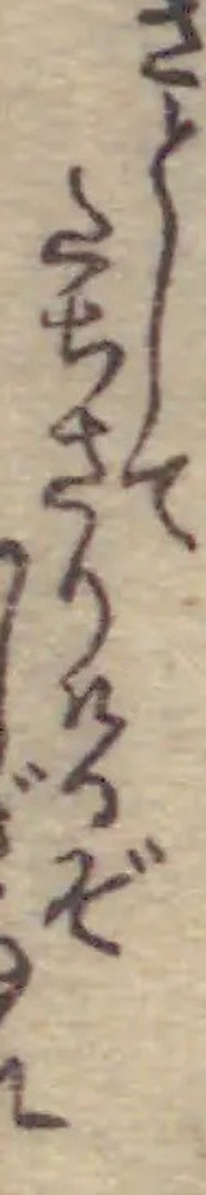たちさりけるぞ
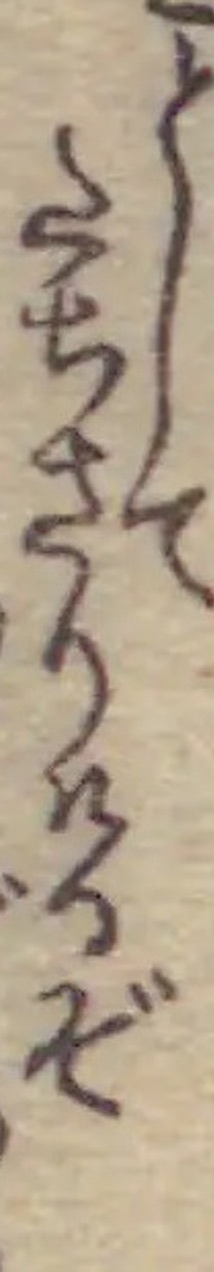たちさりけるぞ
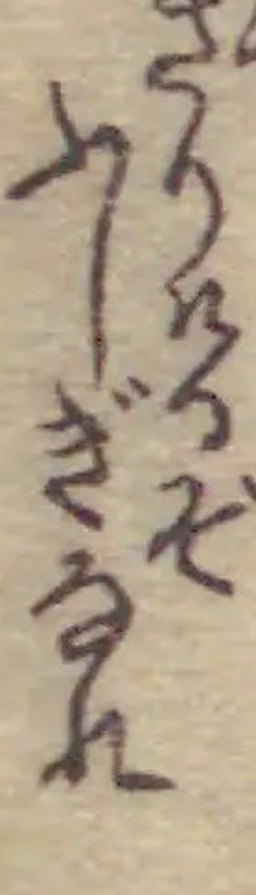ふしぎなれ

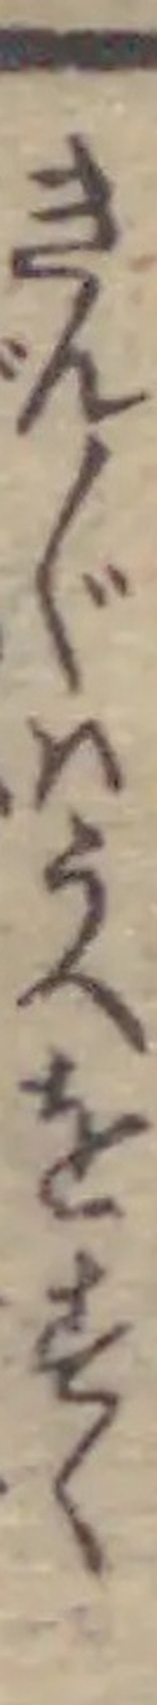きん〴〵はうへをすく
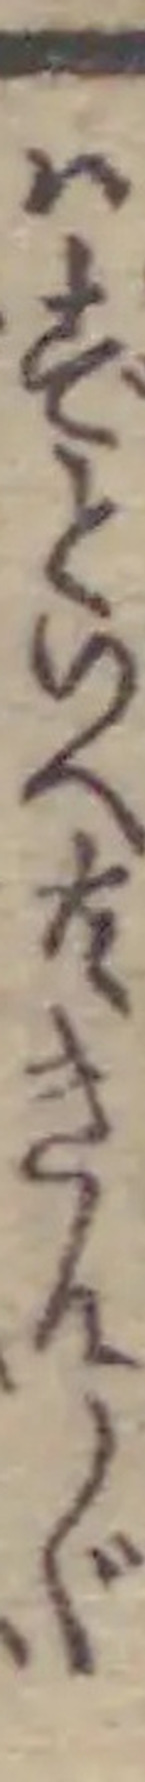はずといへ共きん〴〵
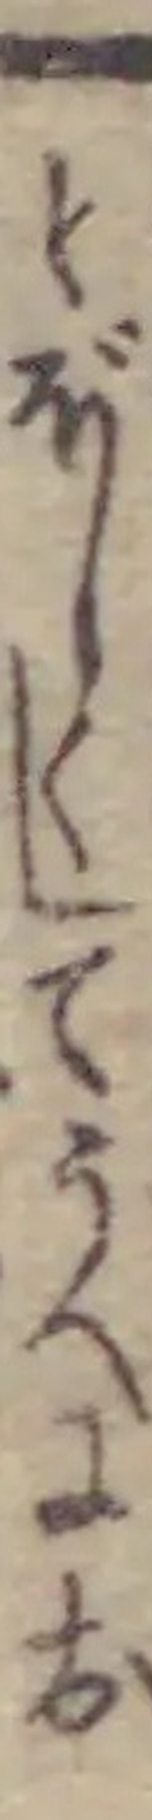とぼしくしてうへにお
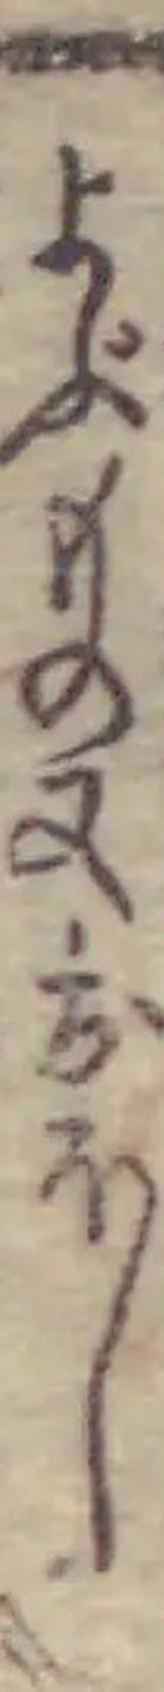よぶもの又おほし
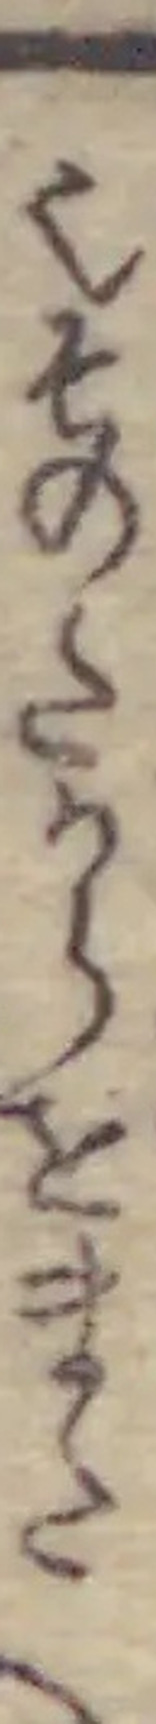也そのたからをまた
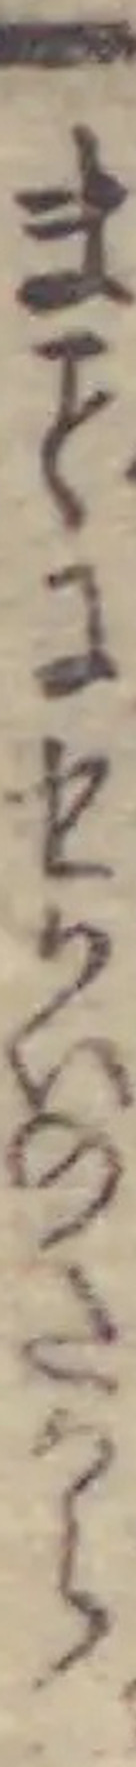まことにせかいのたから
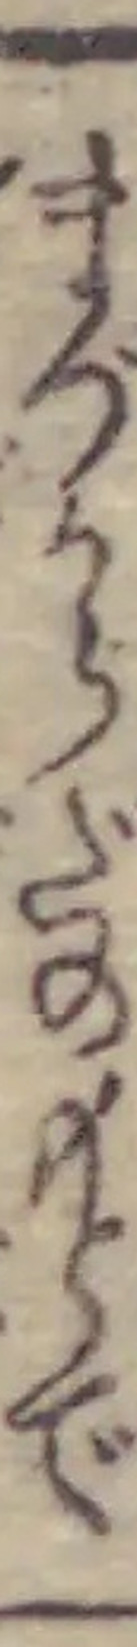まづからだのもとで
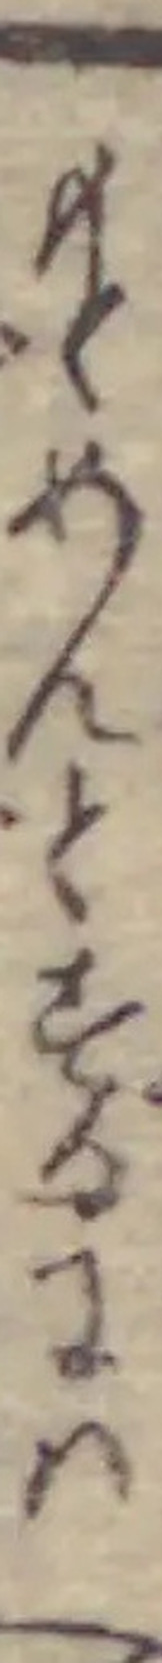もとめんとするには
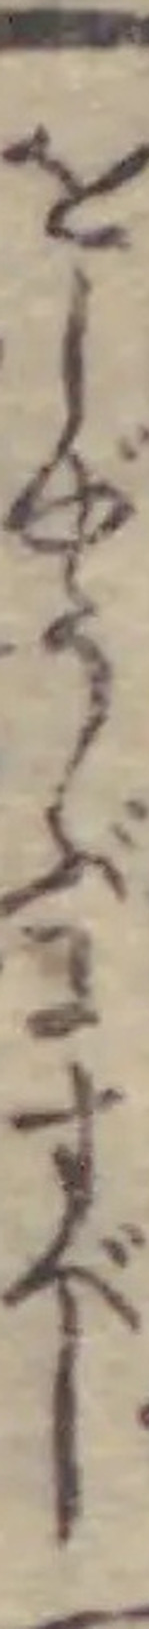をじやうぶにすべし
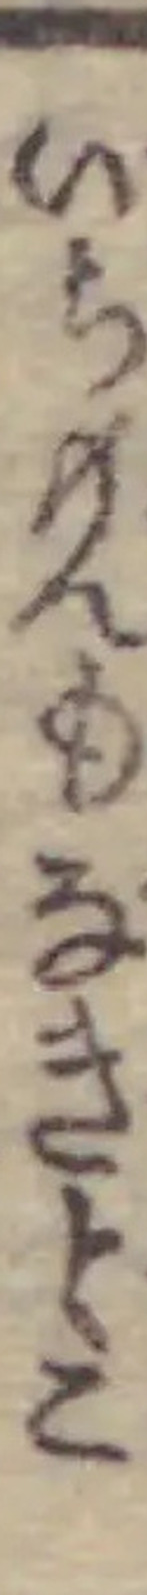いちもんもなきとこ
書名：腹内養生主論 3巻
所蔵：国立国会図書館 National Diet Library, JAPAN
